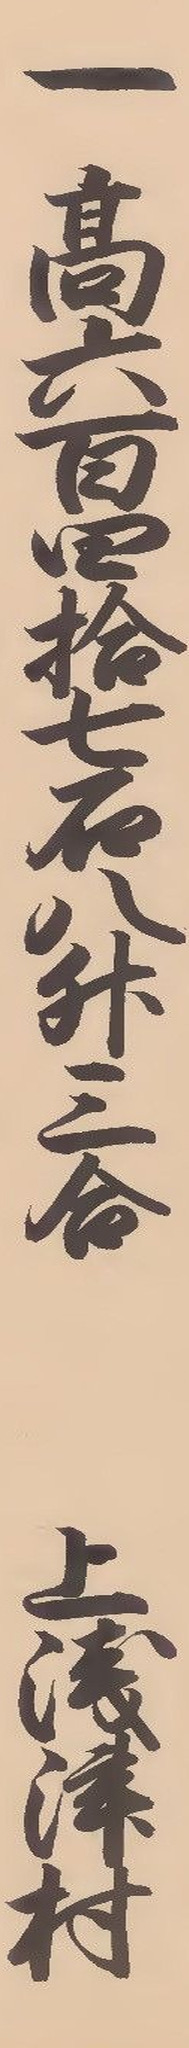一高六百四拾七石八升三合上浅津村
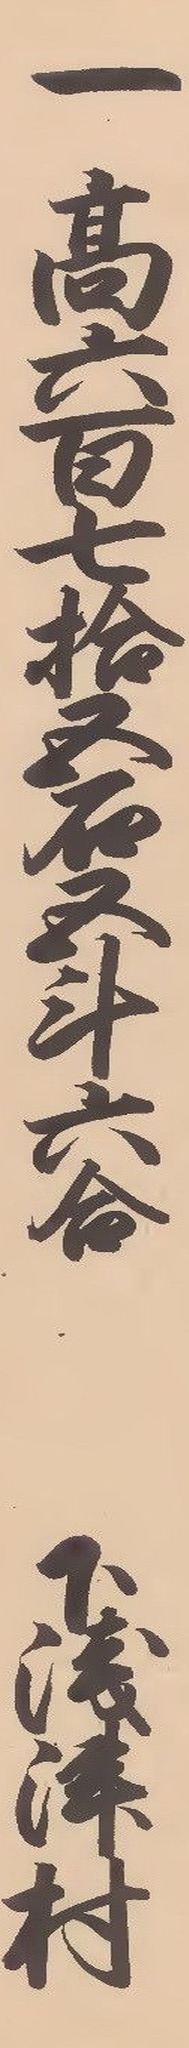一高六百七拾五石五斗六合下浅津村
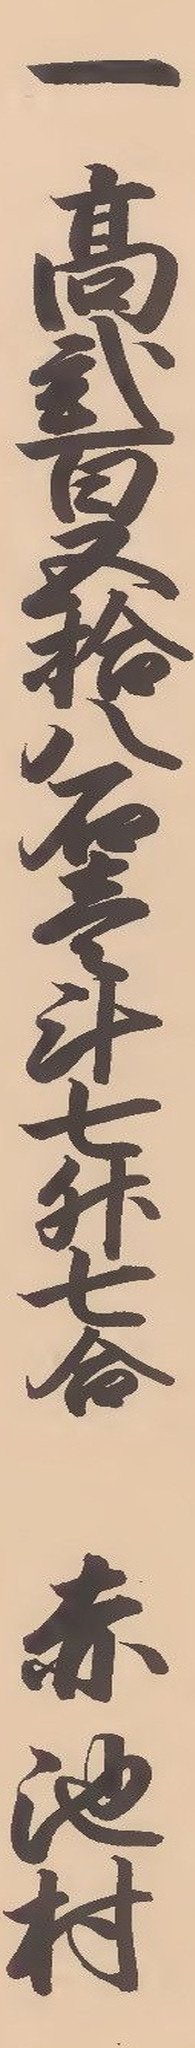一高弐百五拾八石壱斗七升七合赤池村
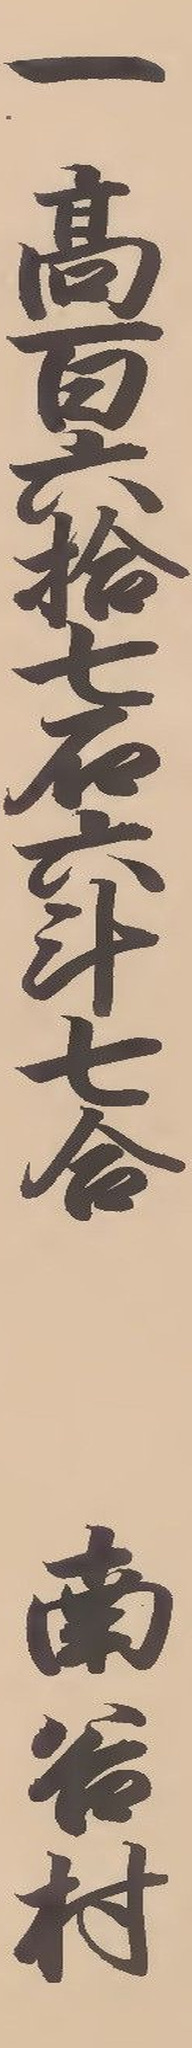一高百六拾七石六斗七合南谷村
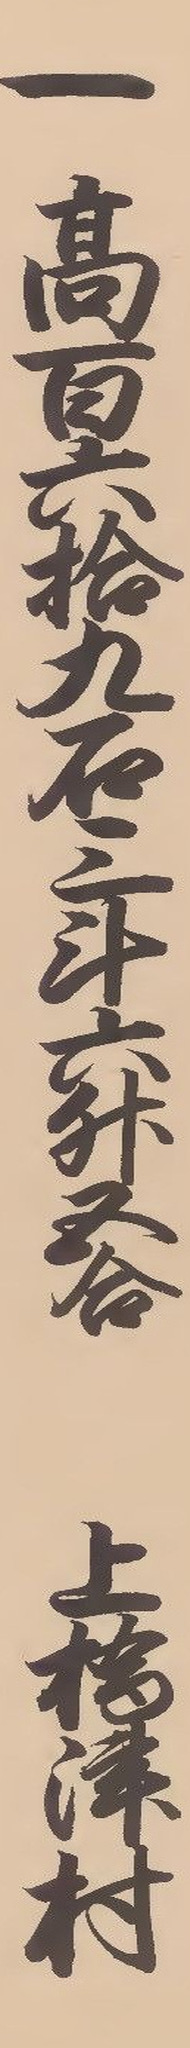一高百六拾九石三斗六升五合上橋津村
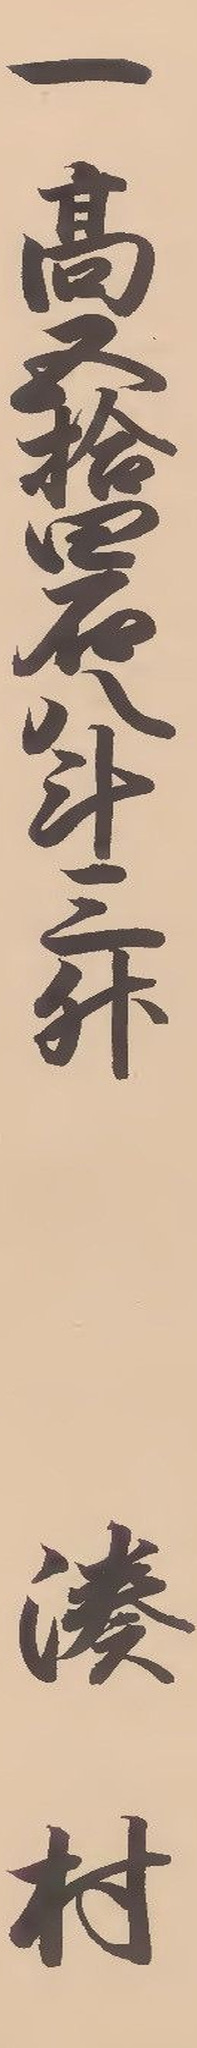一高五拾四石八斗三升湊村

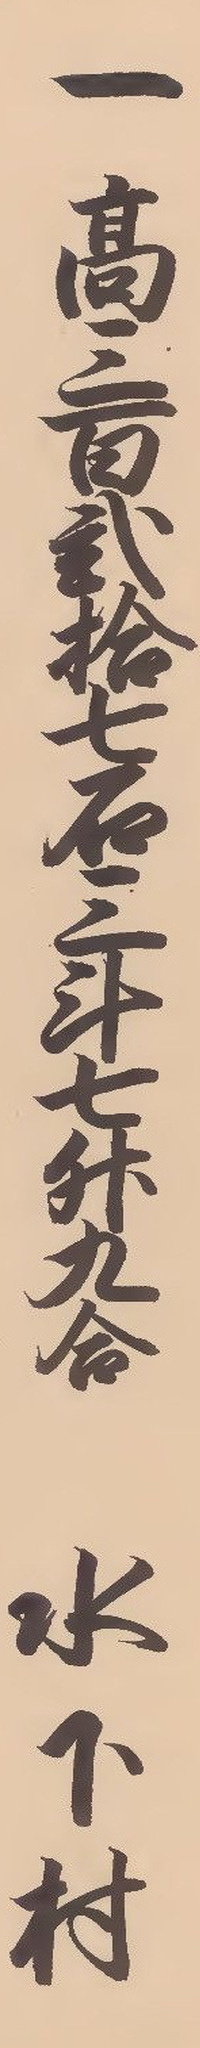一高三百弐拾七石三斗七升九合水下村
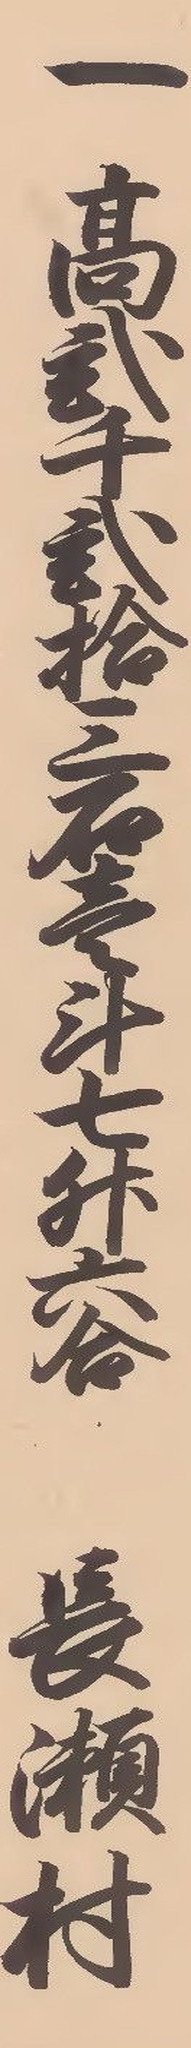一高弐千弐拾三石壱斗七升六合長瀬村
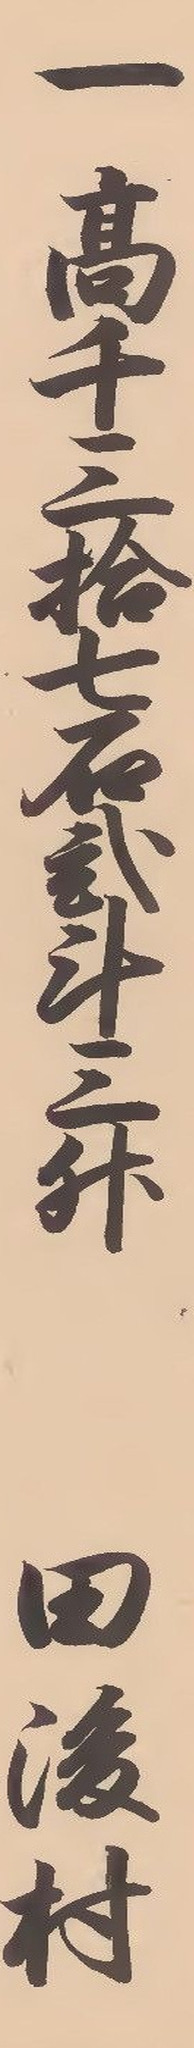一高千三拾七石弐斗三升田後村
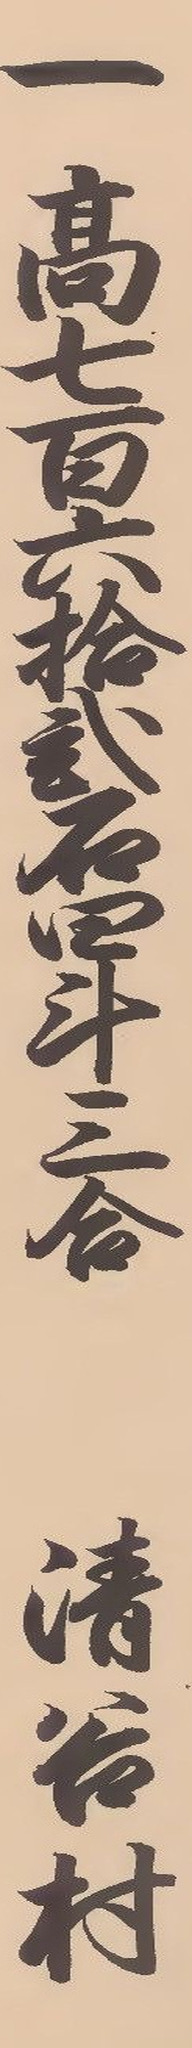一高七百六拾弐石四斗三合清谷村
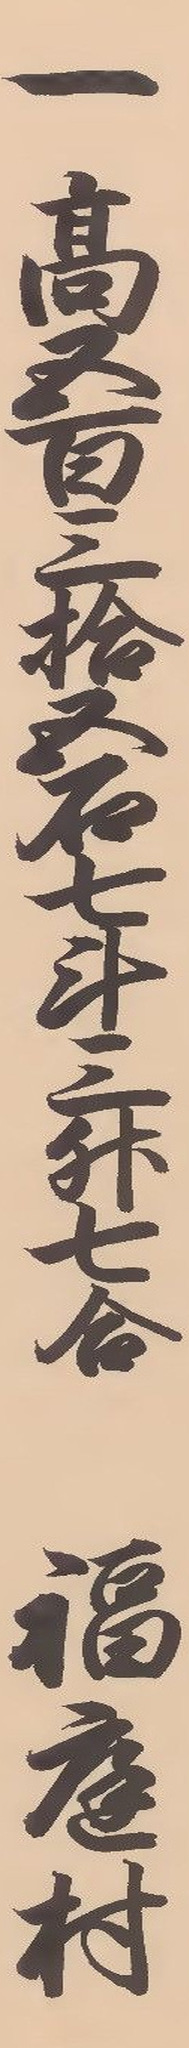一高五百三拾五石七斗三升七合福庭村
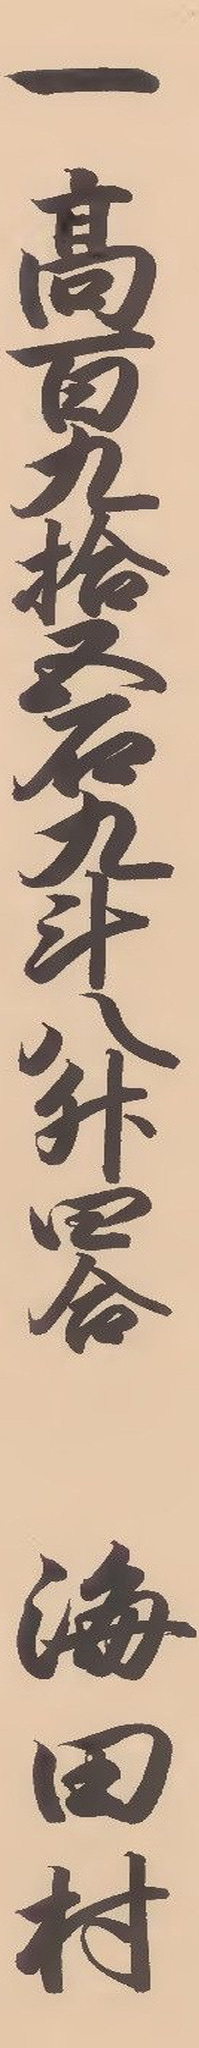一高百九拾五石九斗八升四合海田村
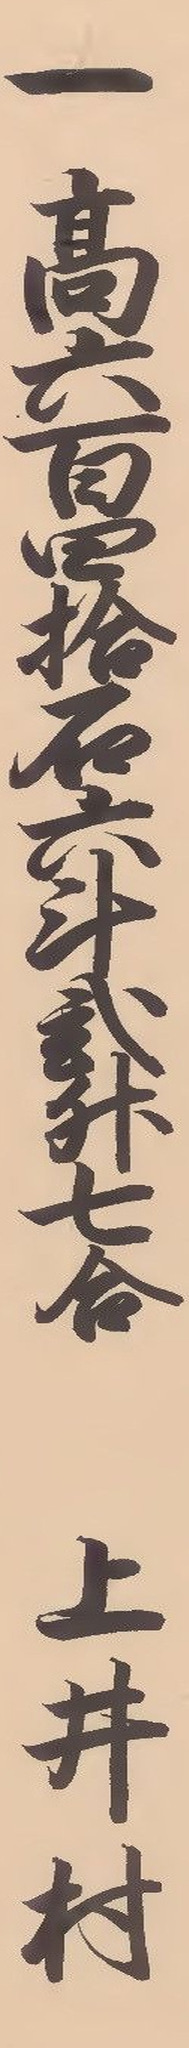一高六百四拾石六斗弐升七合上井村

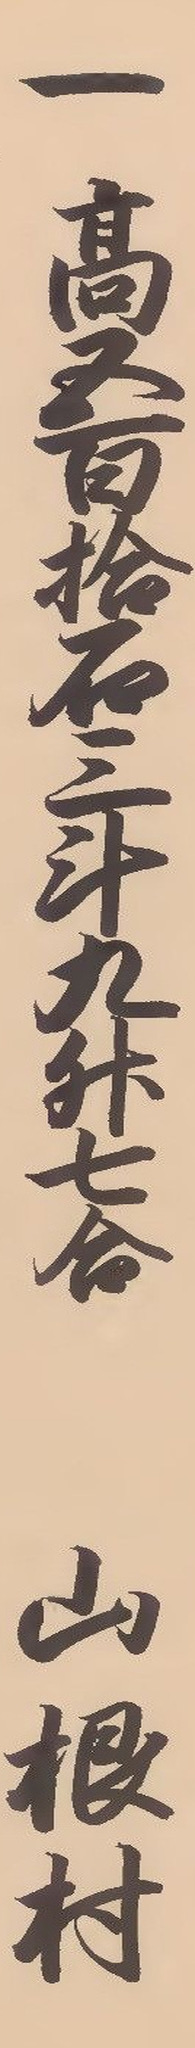一高五百拾石三斗九升七合山根村
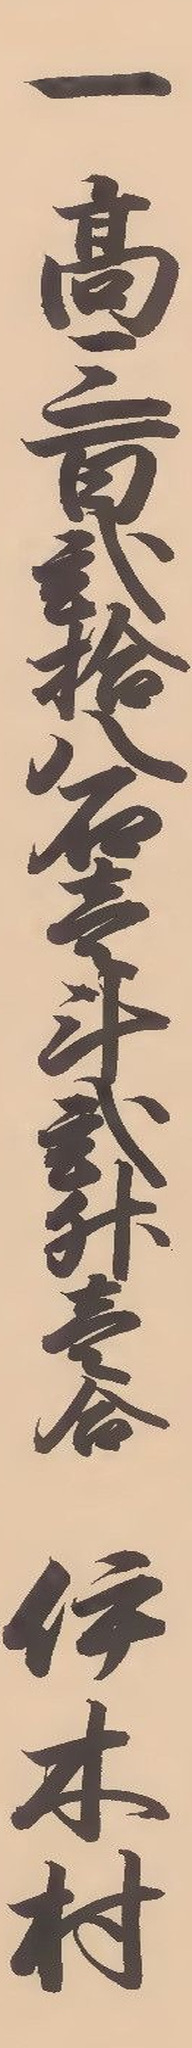一高三百弐拾八石壱斗弐升壱合伊木村
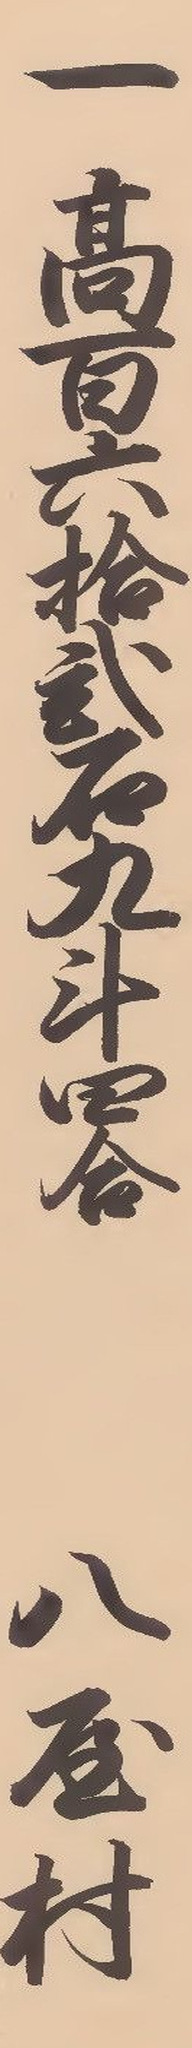一高百六拾弐石九斗四合八屋村
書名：伯耆国郷帳
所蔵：国立公文書館 National Archives of Japan
